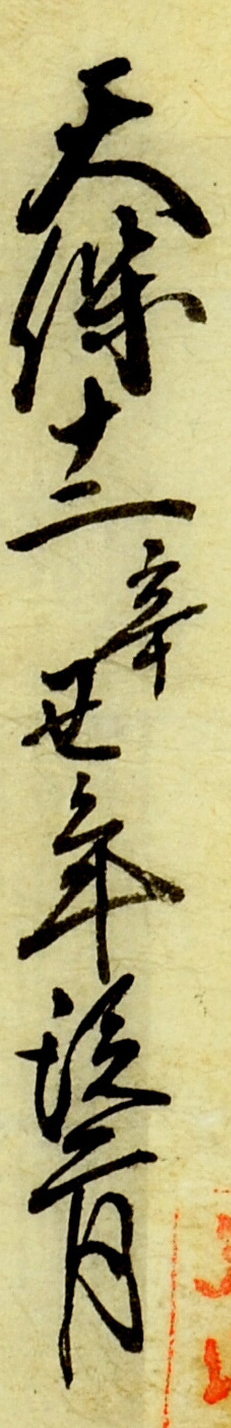天保十二辛丑年従二月
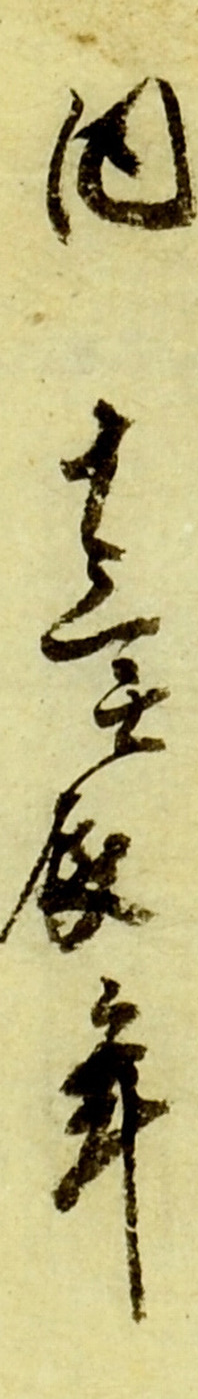同十三壬寅年
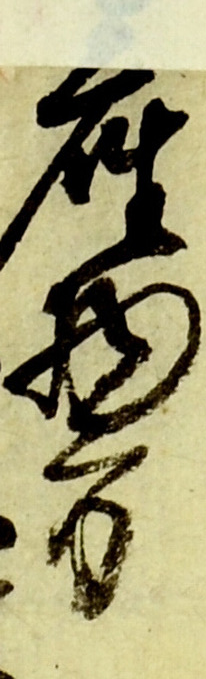産物方
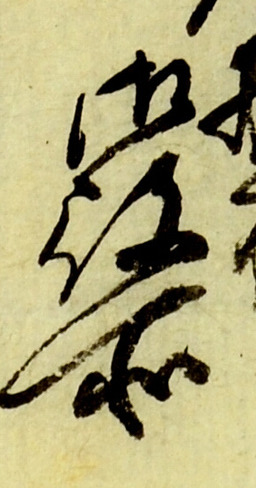御役所

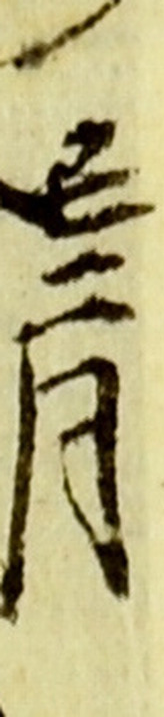丑二月
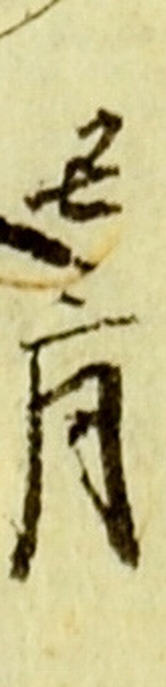丑二月
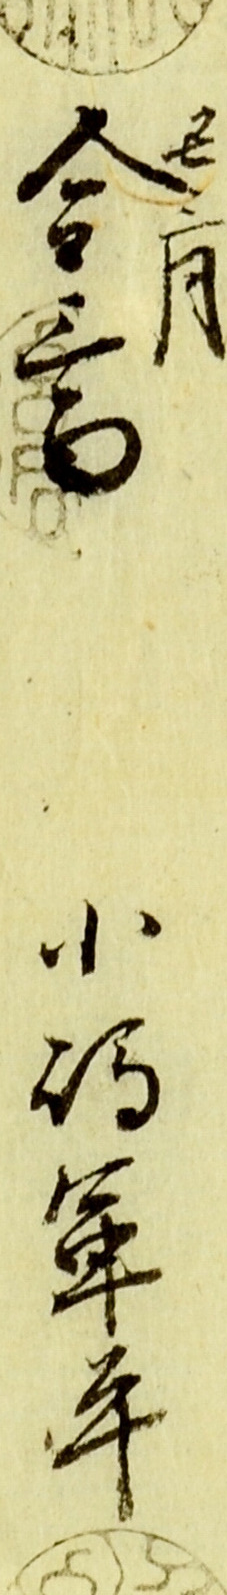金三両小嶋軍平㊞
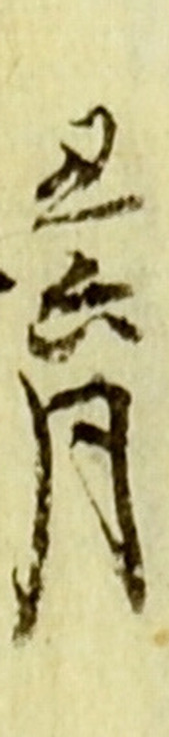丑六月
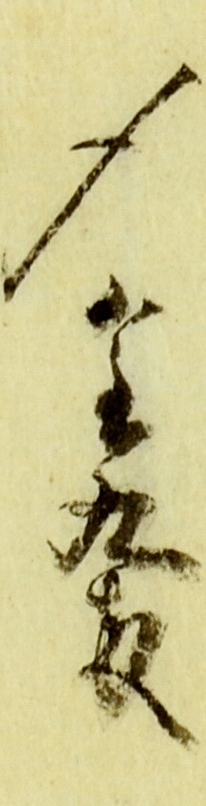〆金九両

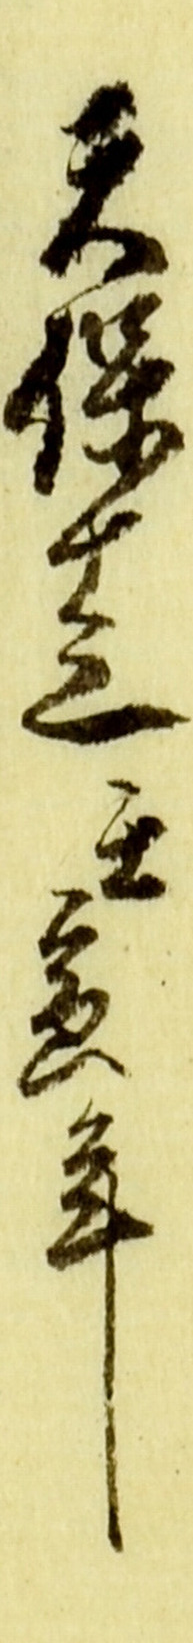天保十三壬辰年
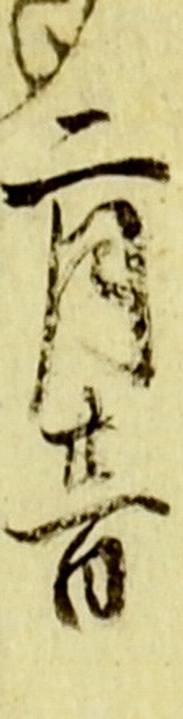二月廿一日
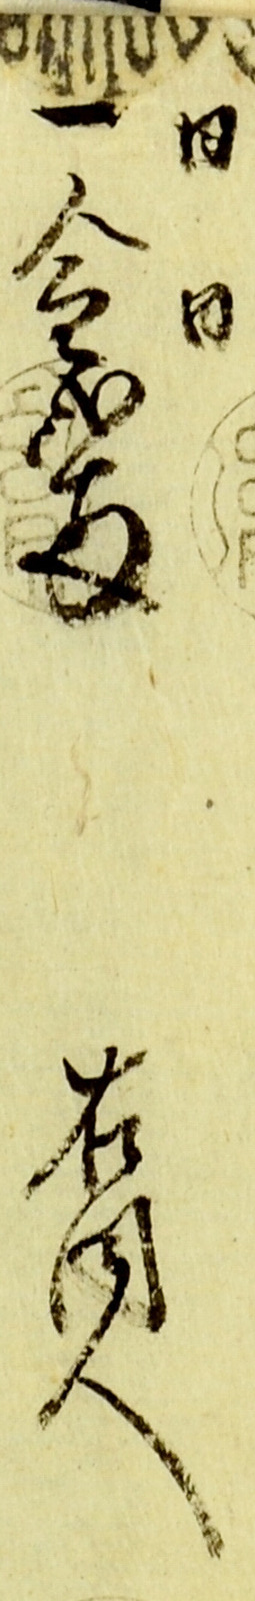一金弐両右同人㊞
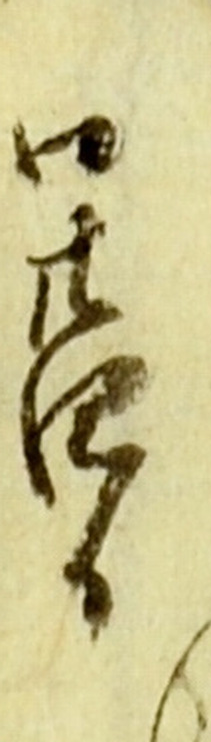同廿四日
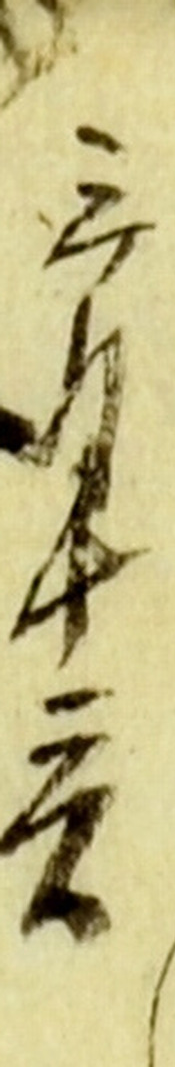三月十三日
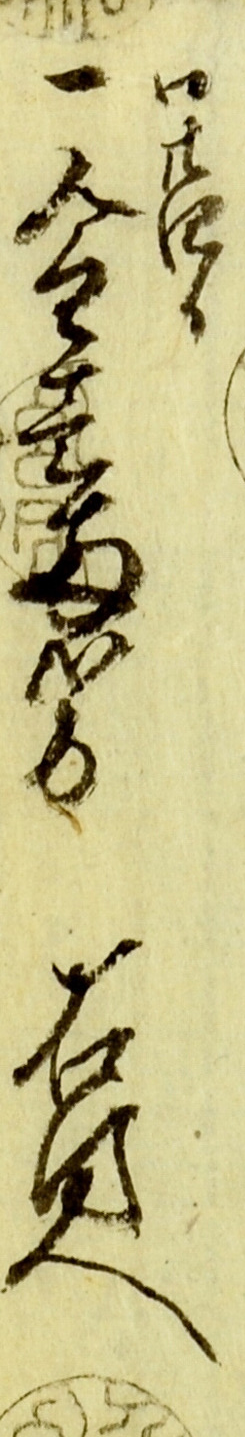一金壱両弐分右同人㊞
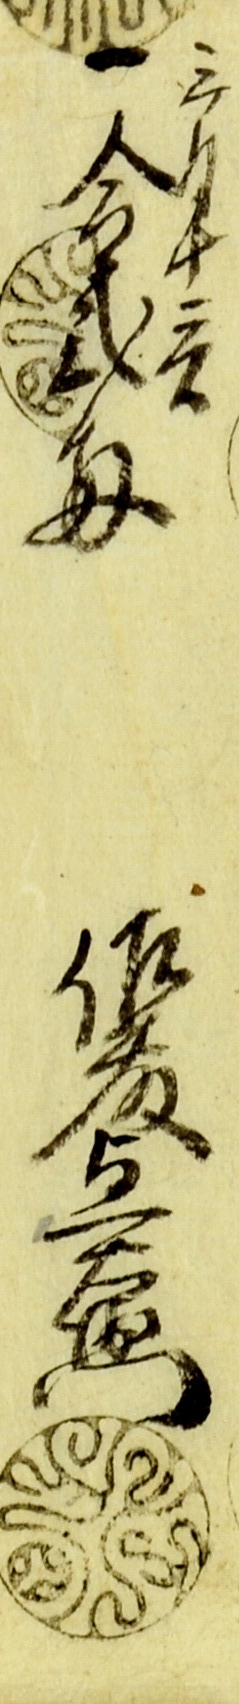一金弐両佐藤与一右衛門㊞
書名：桑畑御入用金請取通
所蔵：伊那市立高遠町図書館・合同会社AMANE
